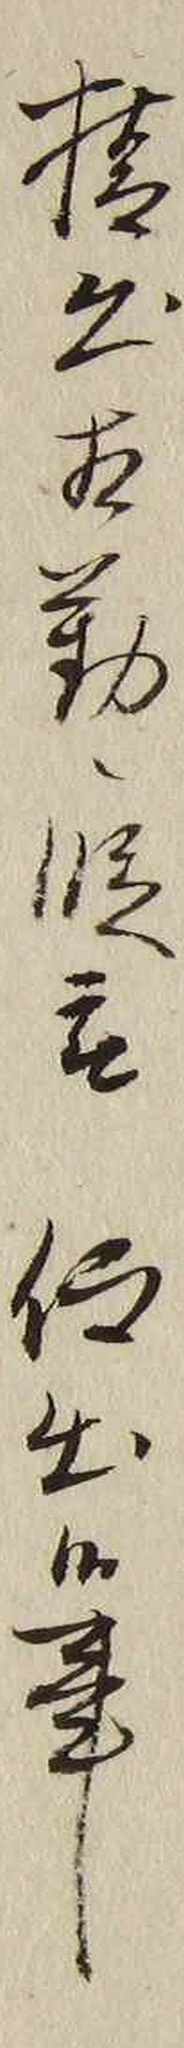精出相勤候段被仰出候事
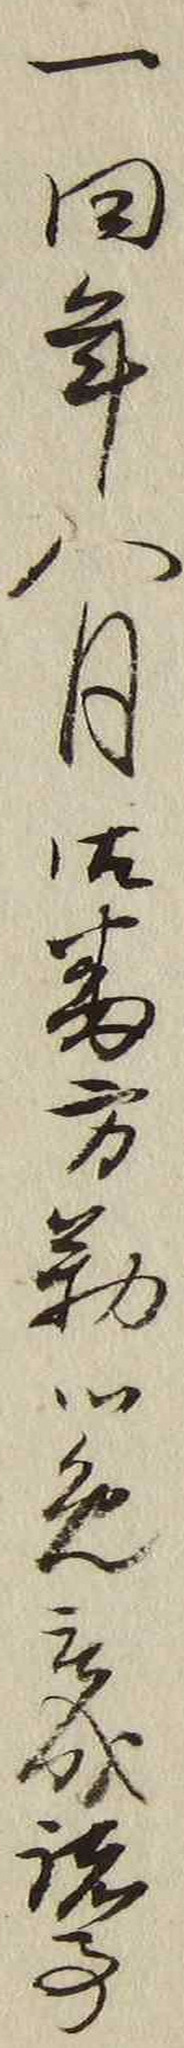一同年八月御番方勤御免被成諸事
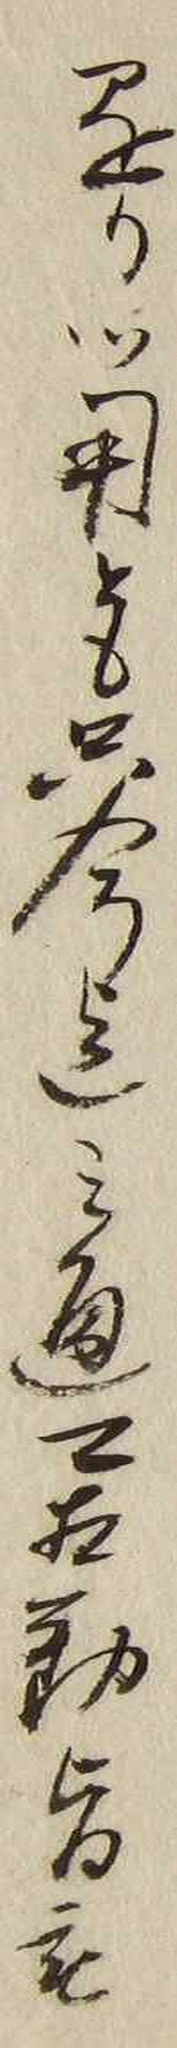懸り御用とも只今迄之通可相勤旨被

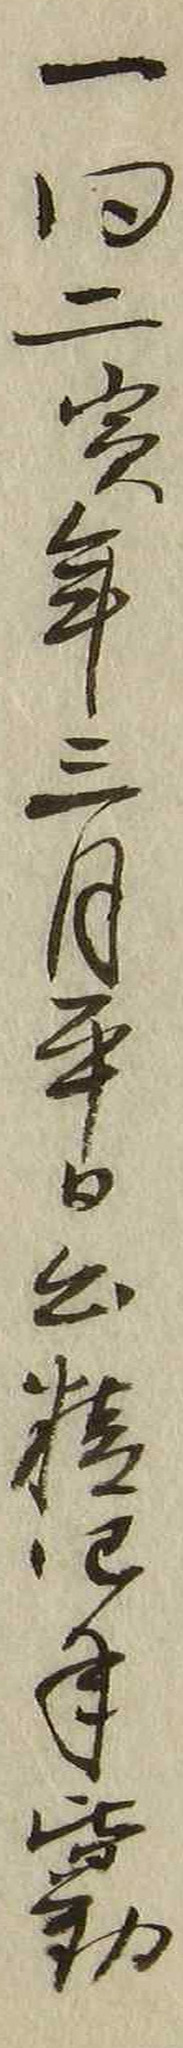一同二寅年三月平日出精四年皆勤
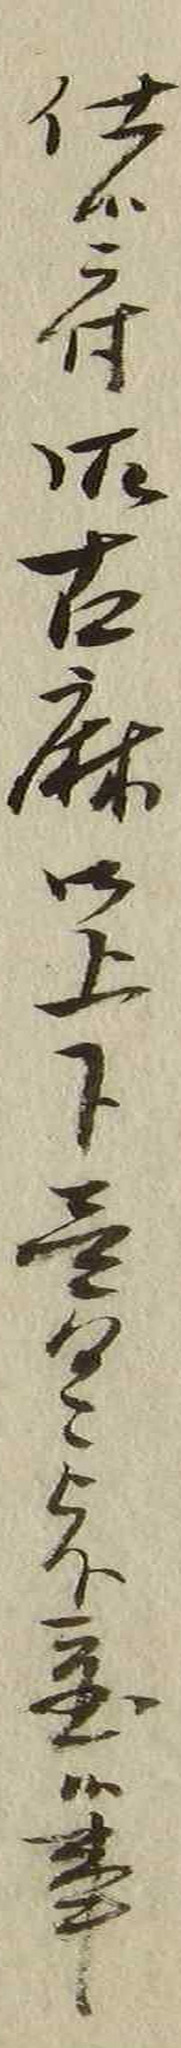仕候ニ付御古麻御上下壱具被下置候事
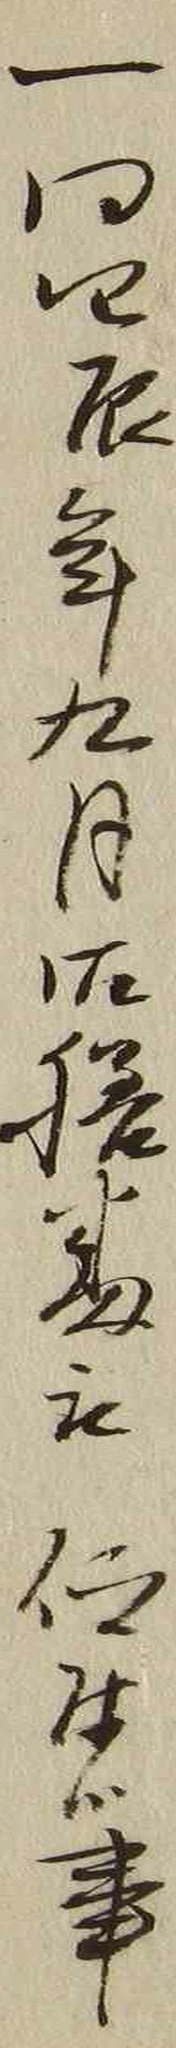一同四辰年九月御膳番被仰付候事
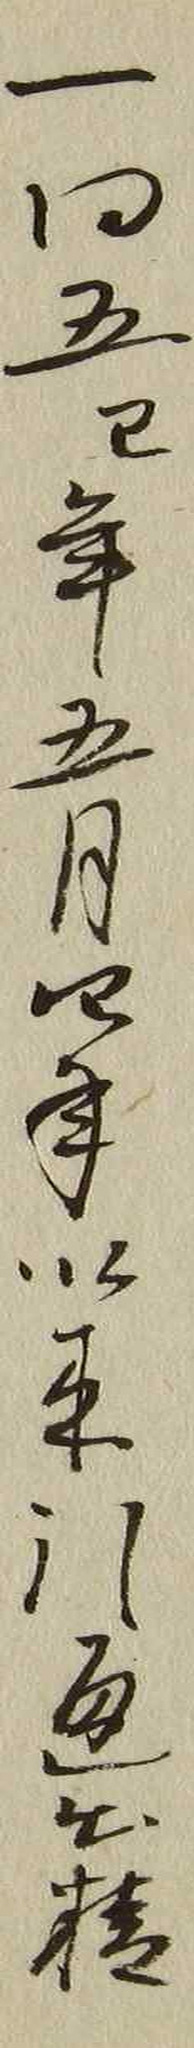一同五巳年五月四年以来引通出精
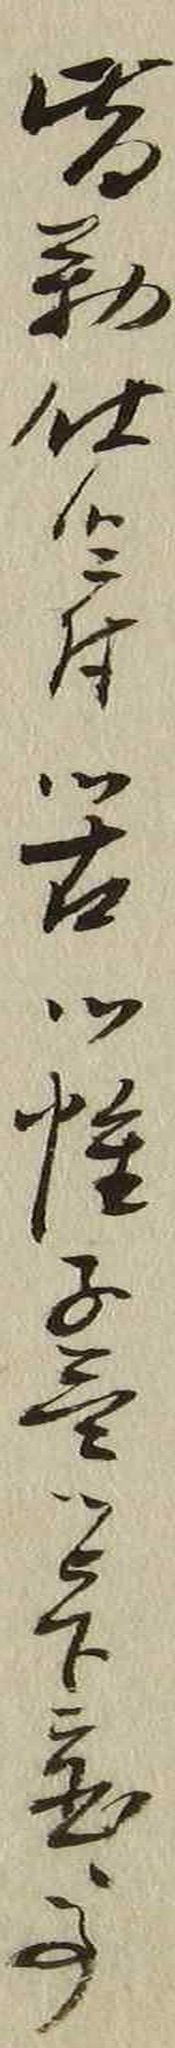皆勤仕候ニ付御古御帷子壱ツ被下置候事
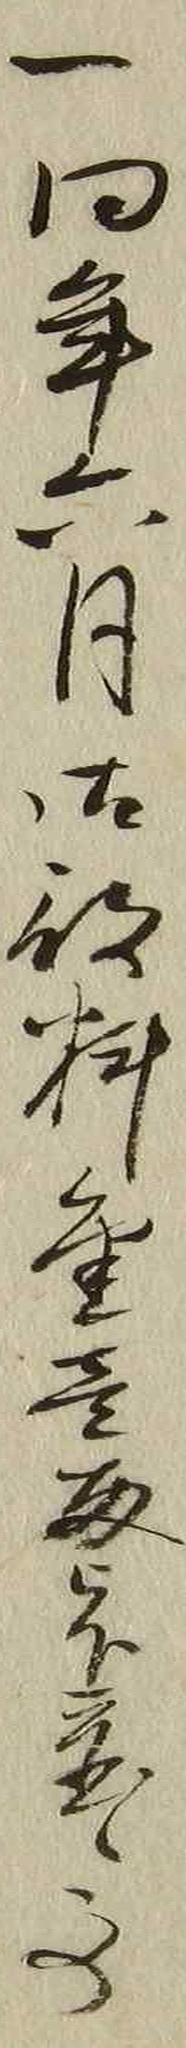一同年六月御役料金壱両被下置候事
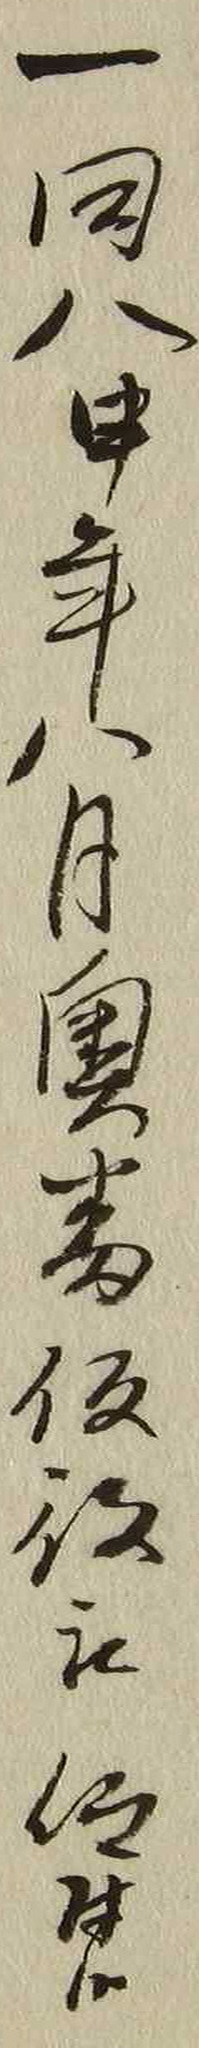一同八申年八月奥番仮役被仰付候
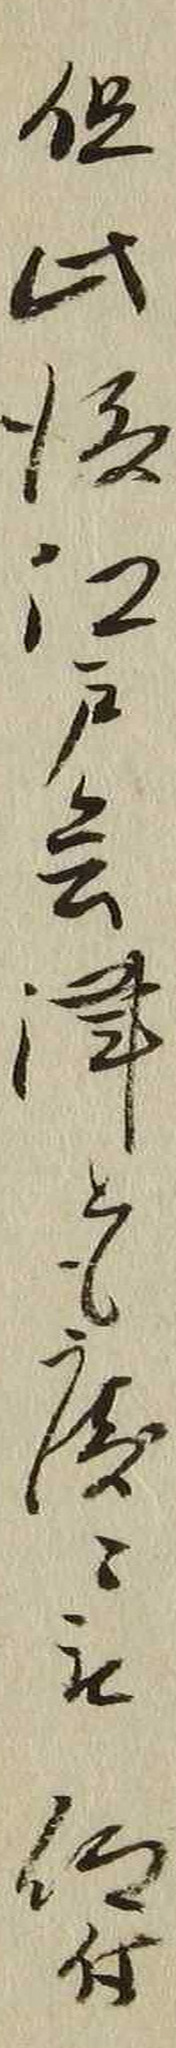但此後江戸会津とも度々被仰付
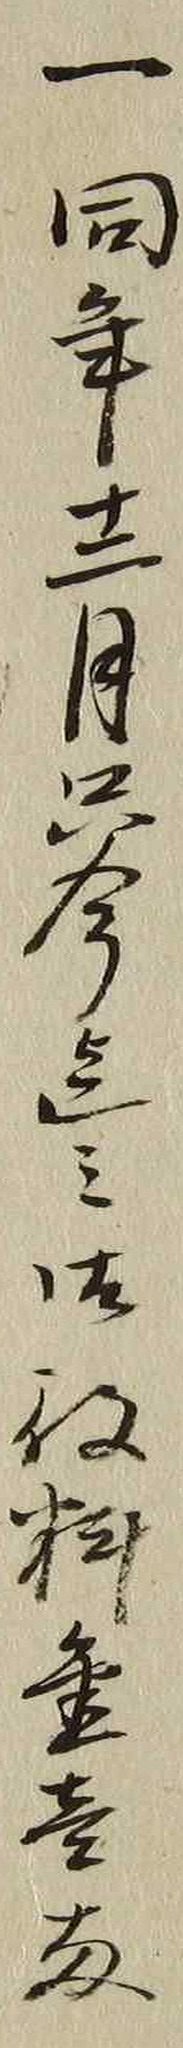一同年十二月只今迄之御役料金壱両
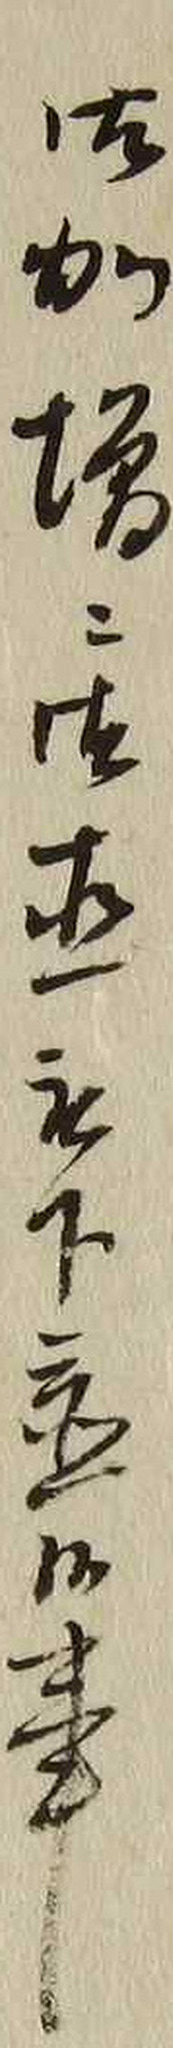御加増ニ御直被下置候事
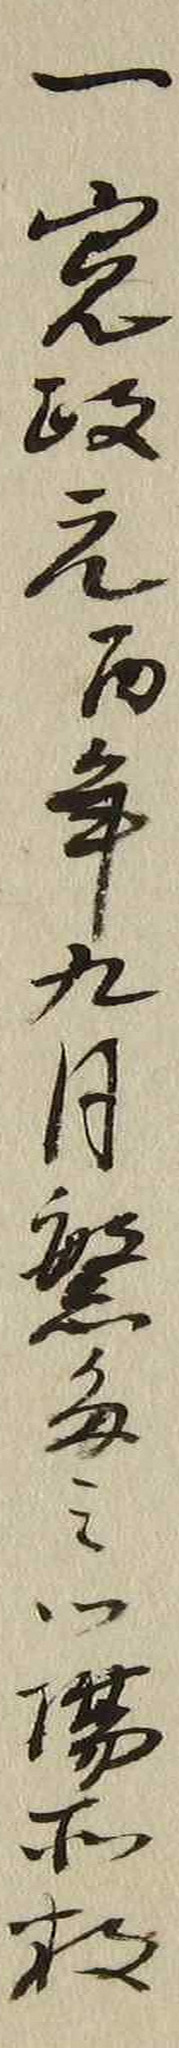一寛政元酉年九月繁多之御場所数
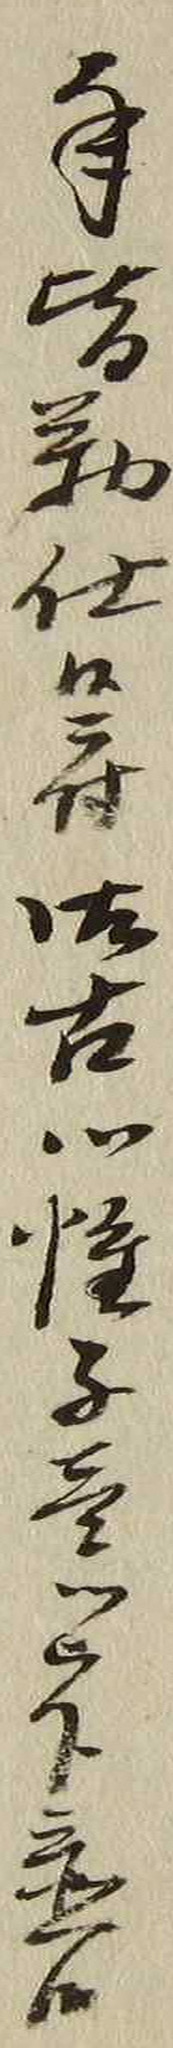年皆勤仕候ニ付御古御惟子壱ツ被下置候
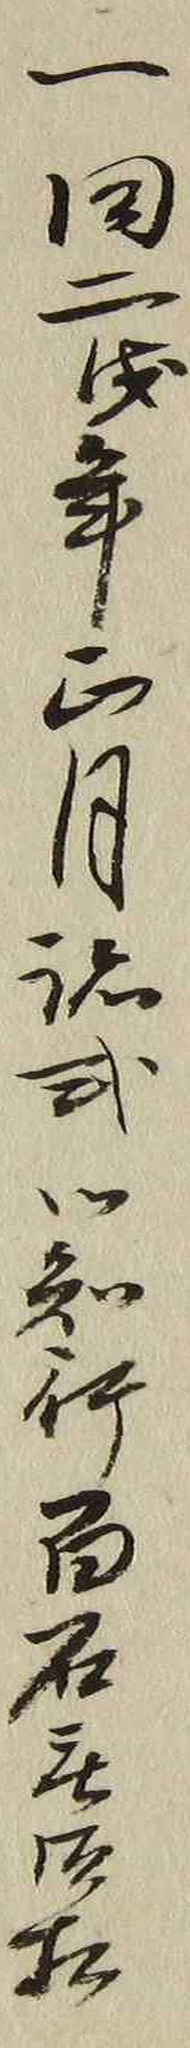一同二戌年正月跡式御知行百石無御相
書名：諸士系譜　巻之359　す之部9
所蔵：会津若松市立会津図書館
